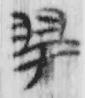○（羽）
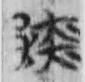郯
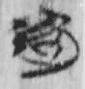○（路）
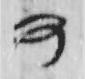尹
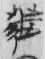發
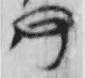尹
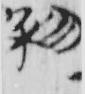利（利）
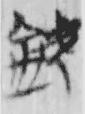欽
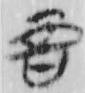言
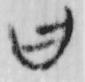曰
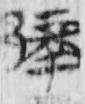鬲
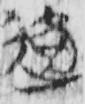○（路）
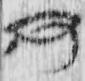尹
